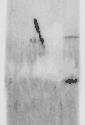{廿九}
